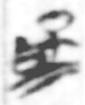爲
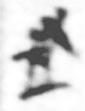○（右）
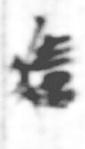驂
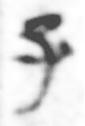子（牸）
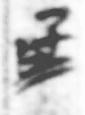爲
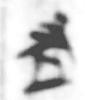○（右）
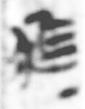飛（騑）
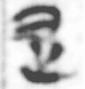疋
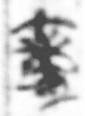𨍱（乘）
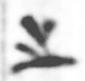之
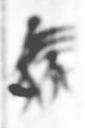六
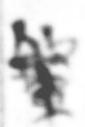馬
